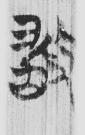敢
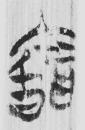{尒䎽}
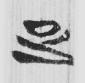疋
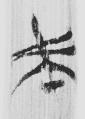民
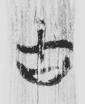古
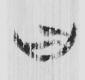曰
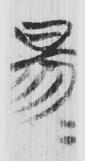昜=
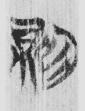則
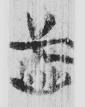{干臼}
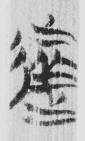{辶止㚔}
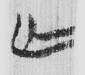亡
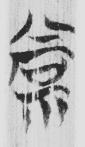常
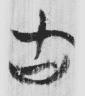古
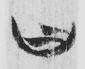曰
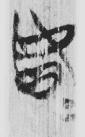母日=
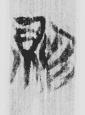則
